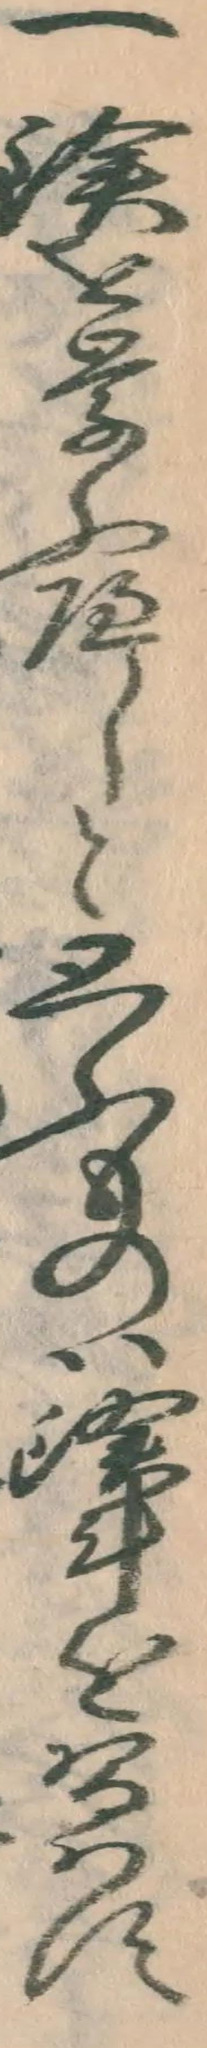一鎗を学ふへしと思ふものハ鎗斗を習ハす
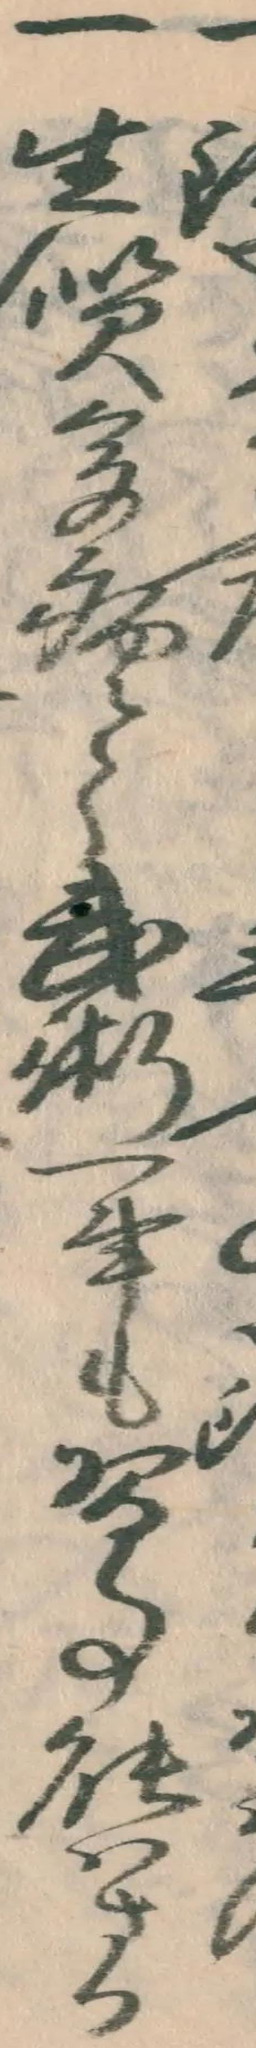一生質多病ニて武術一事も習事能ハさる
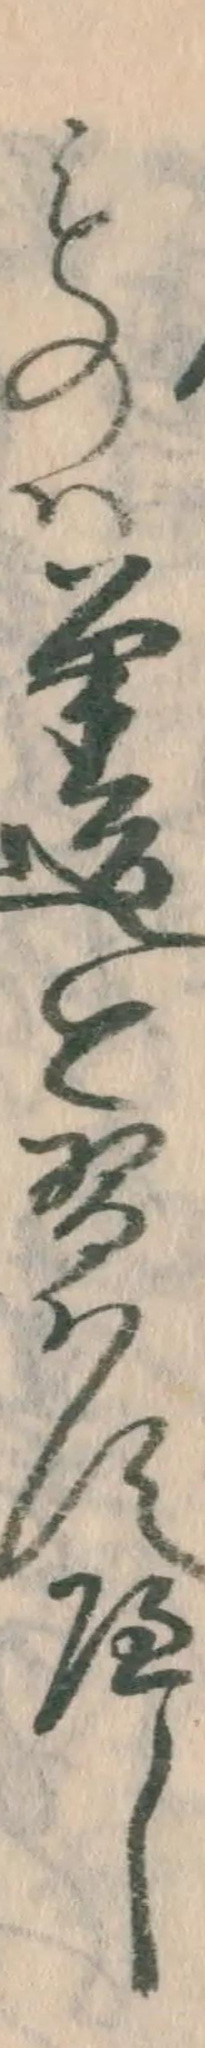ものハ筆道を習ハすへし
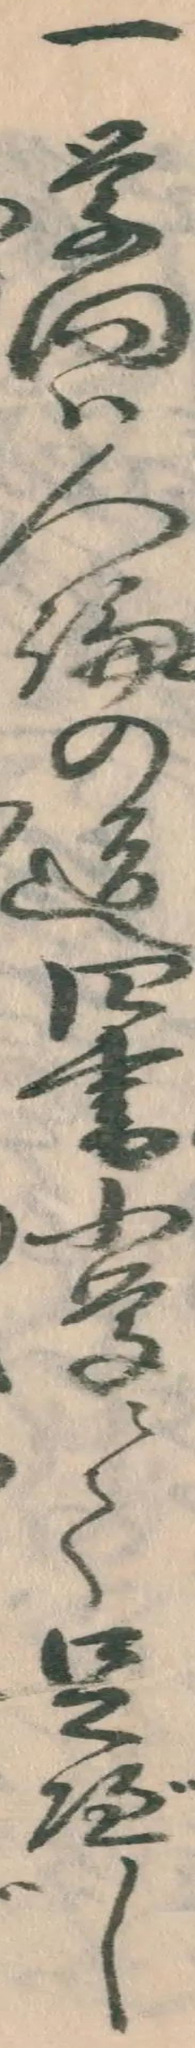一学問ハ人倫の道四書小学ニて足べし
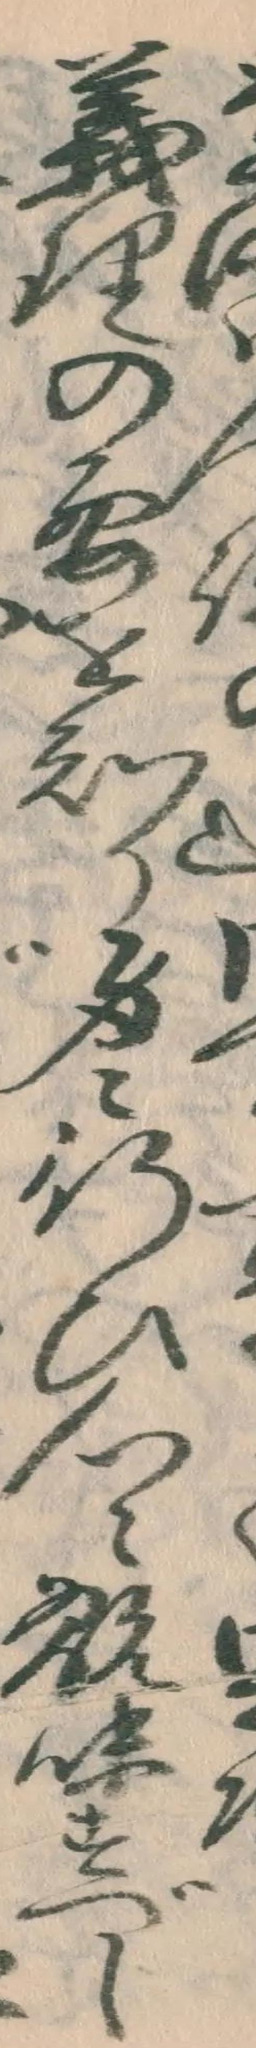義理の要を知り身ニ行ひ心ニ翫味すべし
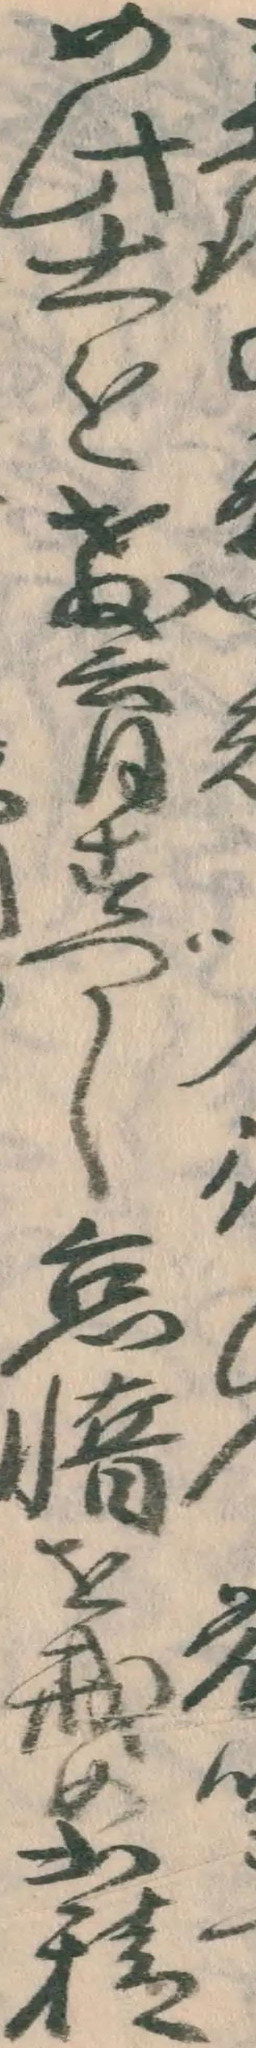如此士を教育すべし怠惰を戒め出精
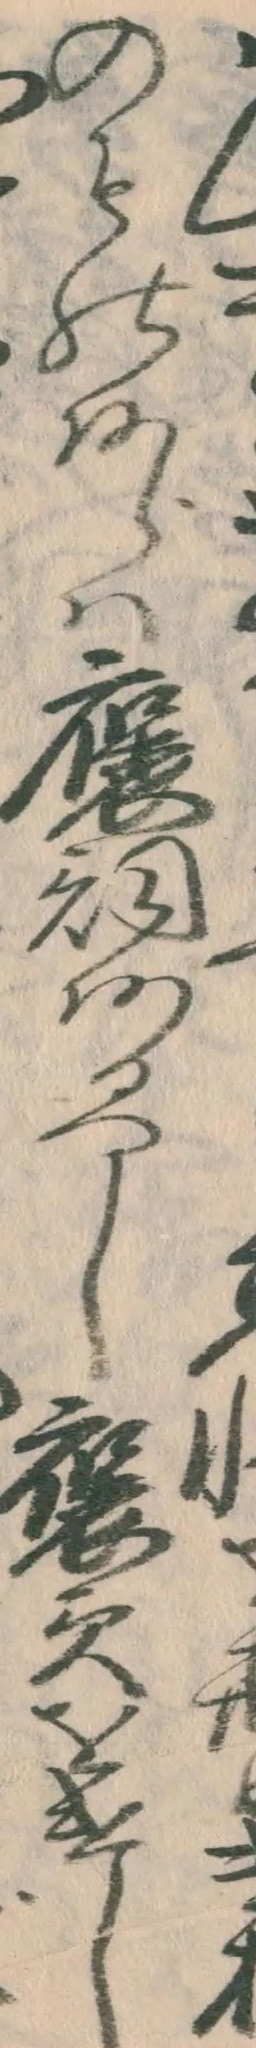のものならハ褒詞あるへし褒美を遣し
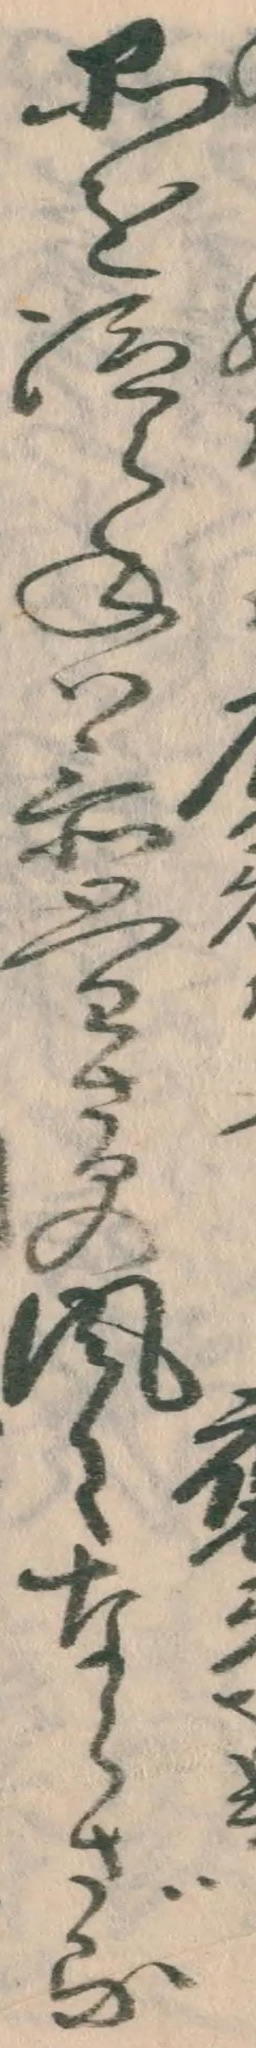品を給らねハ忝思わさるの風にならざる
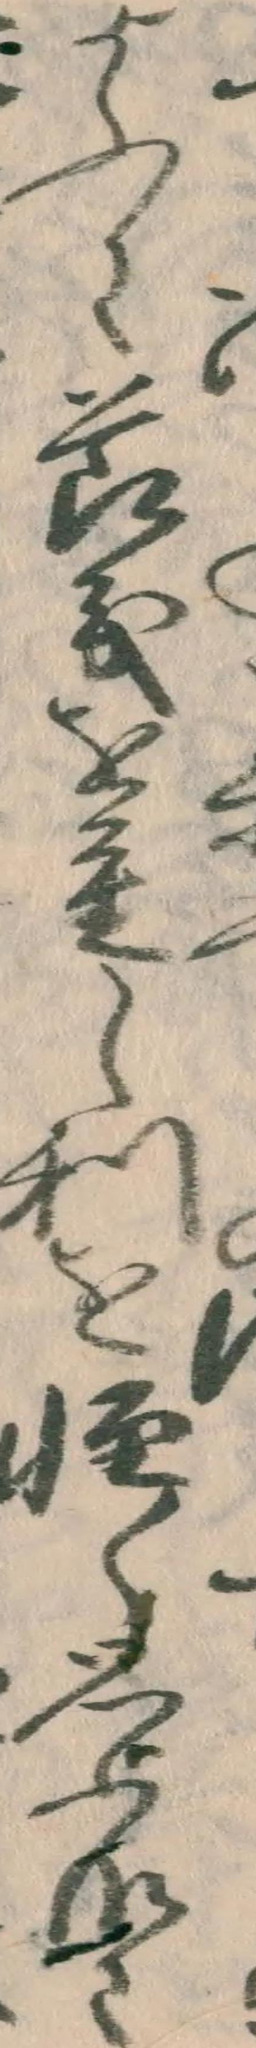よふに節義を重し利を軽く思ふ様に
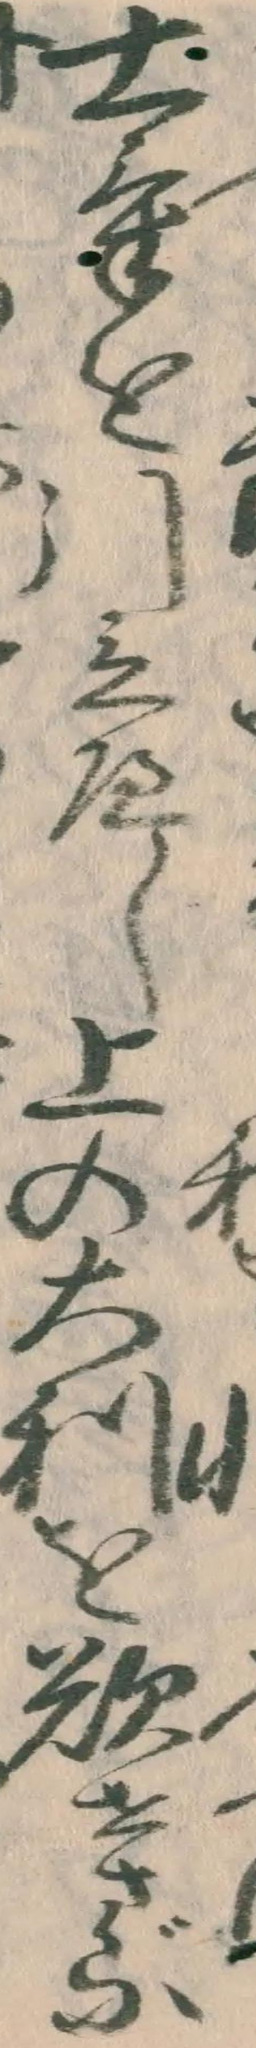士気を引立へし上の大利を欲せざる
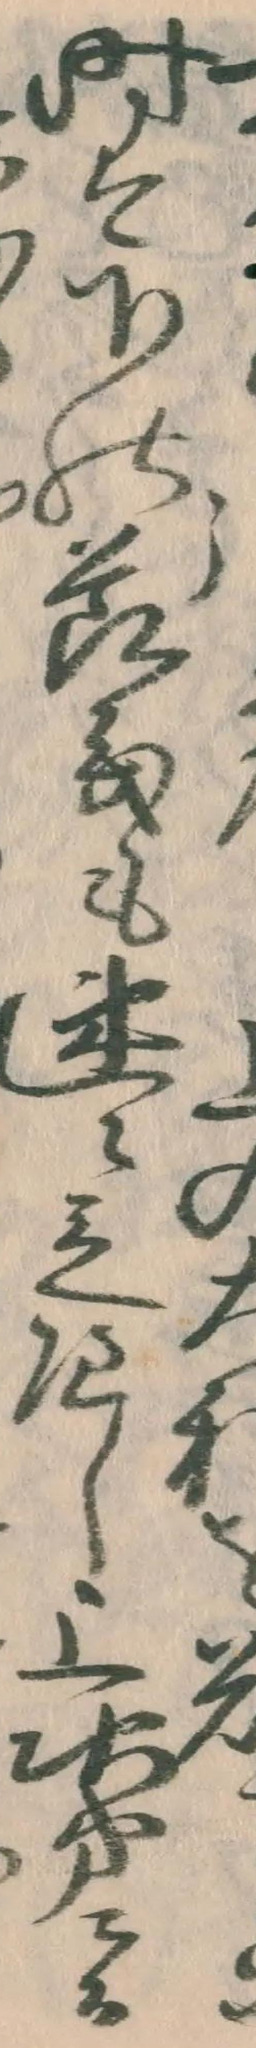時は下の節義も速ニ立へし上次第ニ而
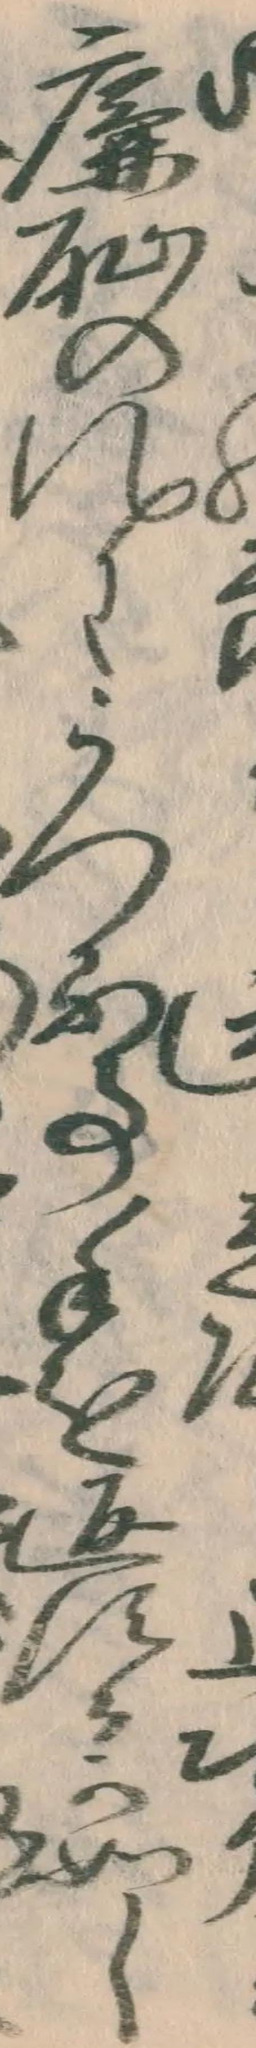廉恥の風にうつる事手を返するか如し
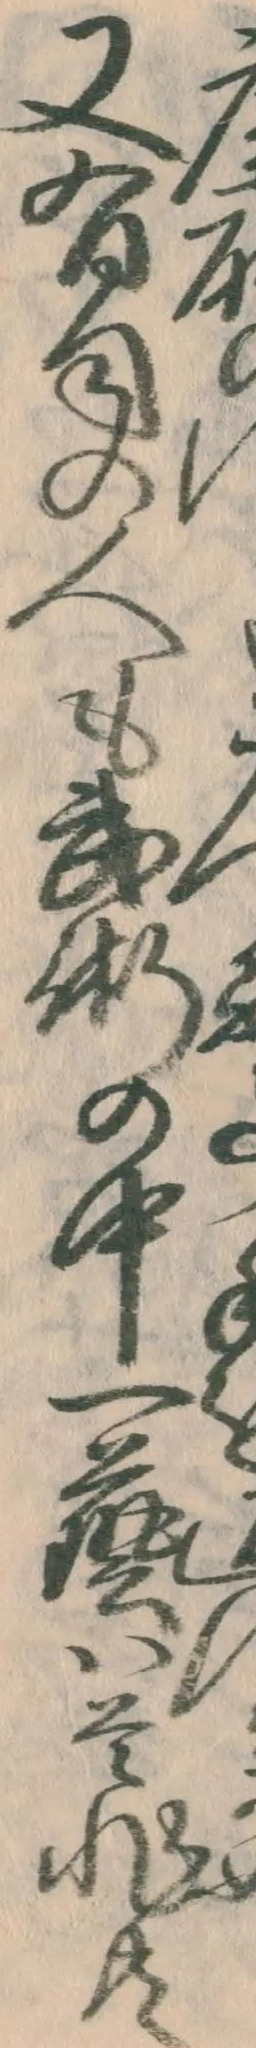又有司の人も武術の中一藝ハ是非共
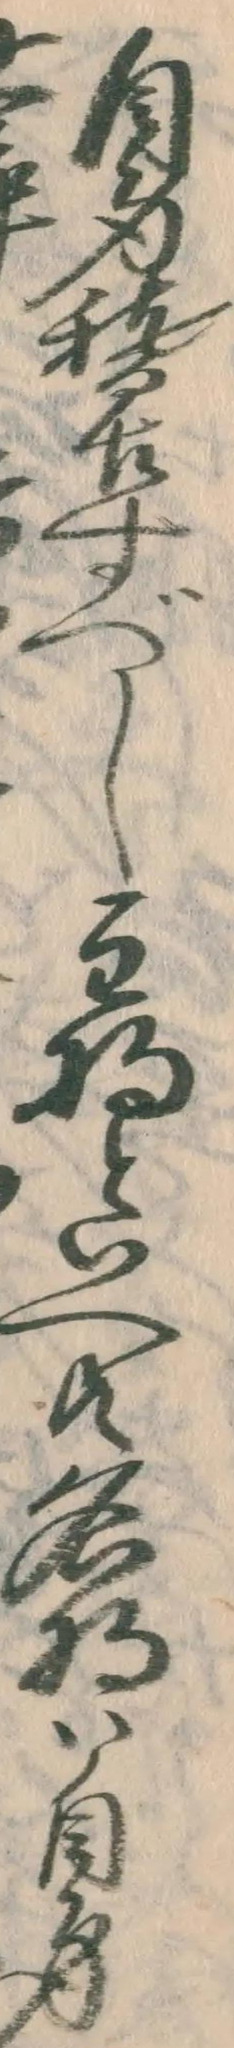自身稽古すべし主将といへ共名将ハ自身
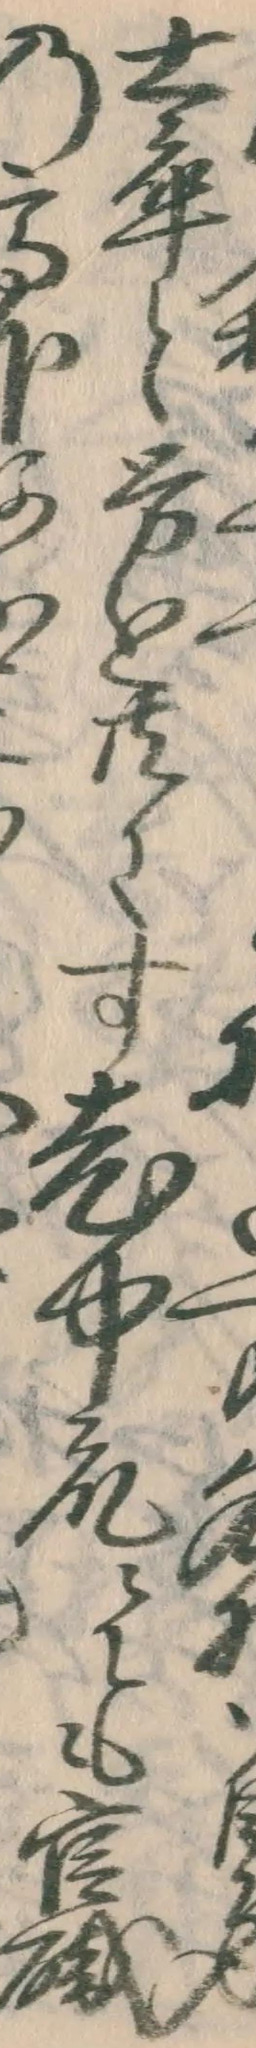士卒と労を共にす老中衆ニても官職
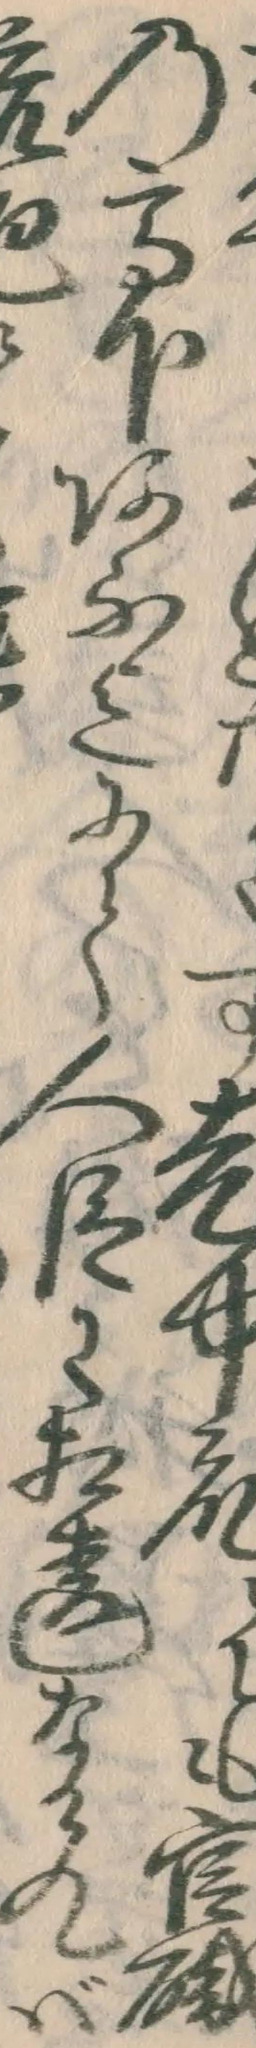の高下ある迄にて人臣に相違なけれバ
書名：麗斎叢書. 20
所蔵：国立国会図書館 National Diet Library, JAPAN
